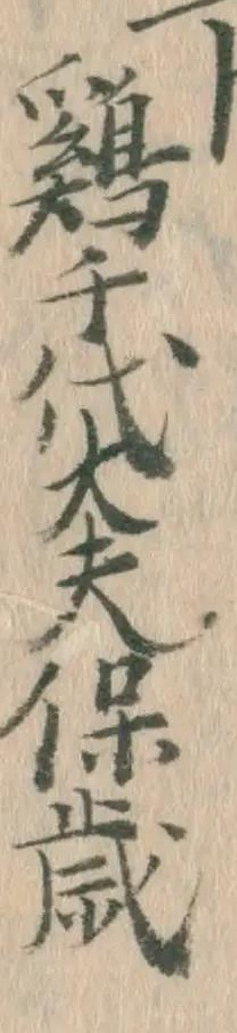鶏千代大夫保歳
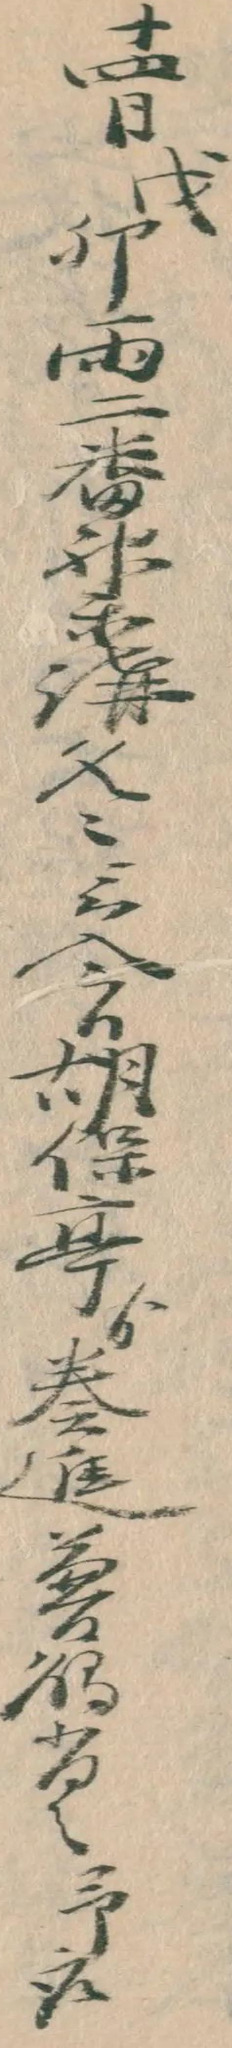十四日戊卯雨二番神楽講久々ニ而今日胡保亭ゟ奏進兼日触有之予取
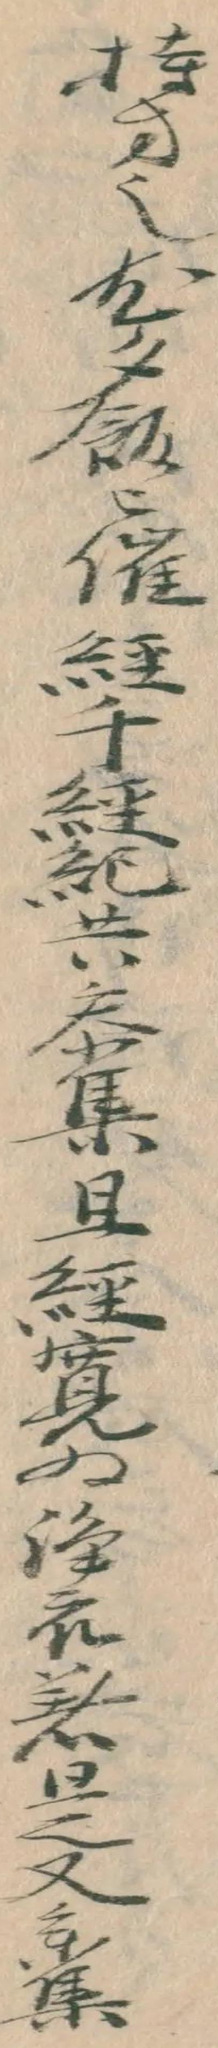持方也尤夕飯被催経千経紀共参集且経寛為浄衣着是又参集
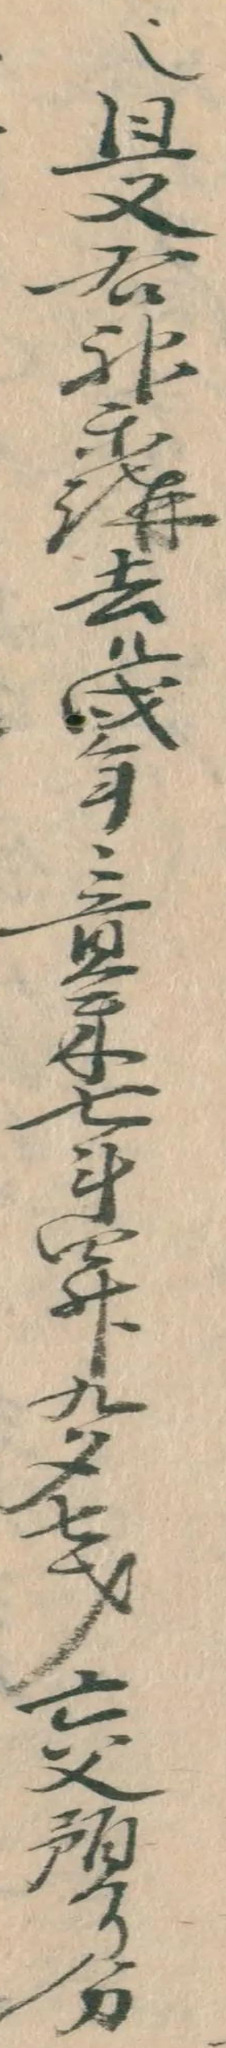也且又右神楽講去ル戌年々貢米七斗四升九夕七才亡父預り分
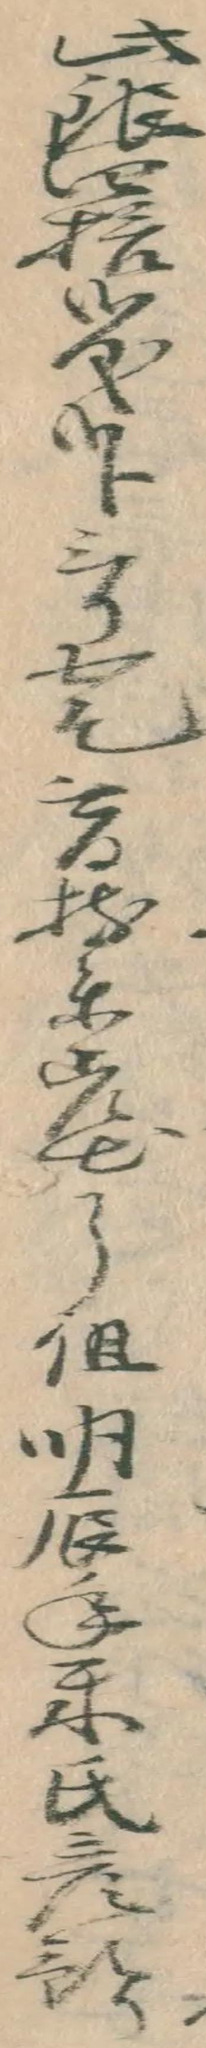此銀四拾弐匁弐分三り今日持参差出了但明辰年米氏彦預り

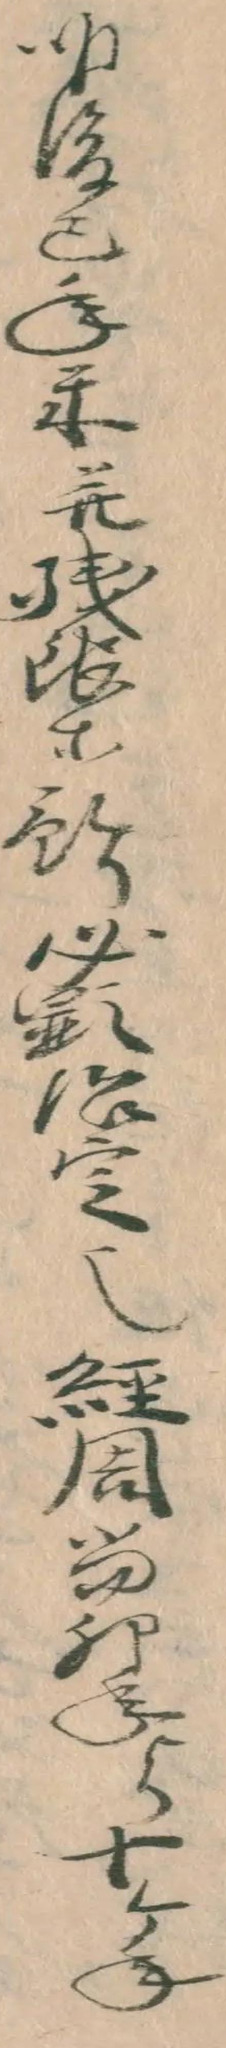明後巳年米幷残銀等預り必顕治定也経周當卯年より十ヶ年
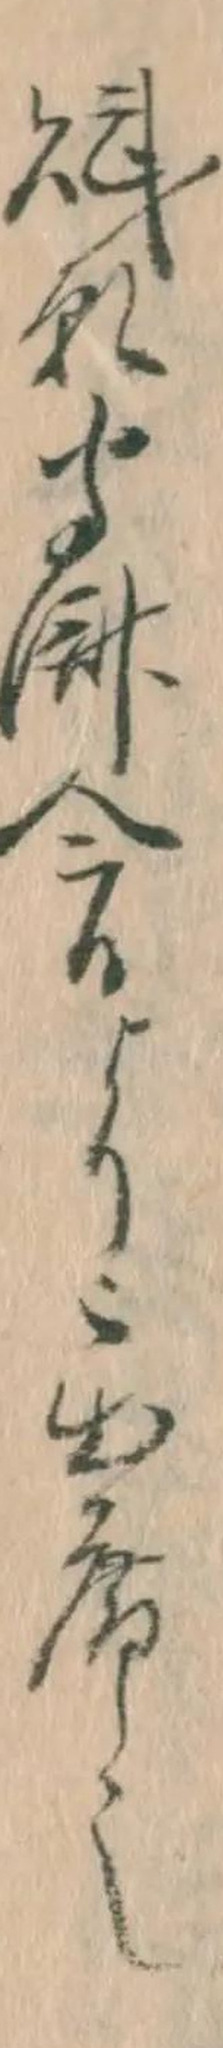賦願聞済今日より被出席也
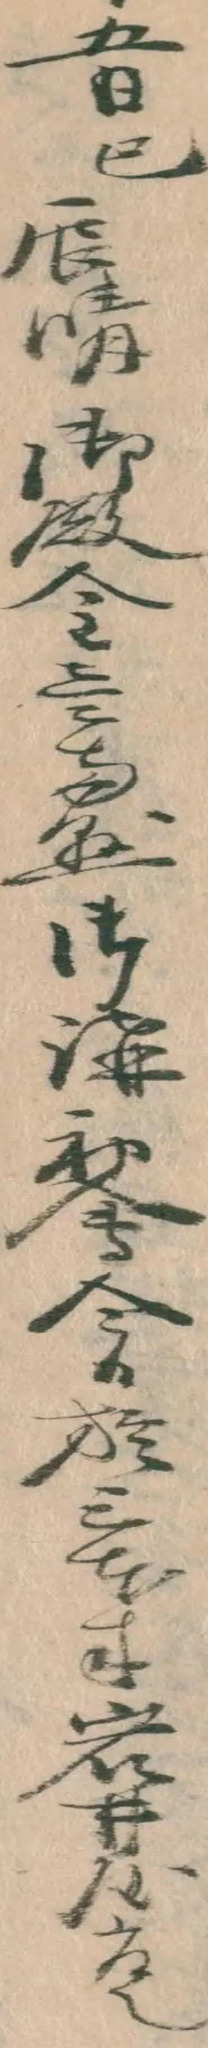十五日己辰晴御殿金壱両懸御講初會今日於三本木岩井屋有之
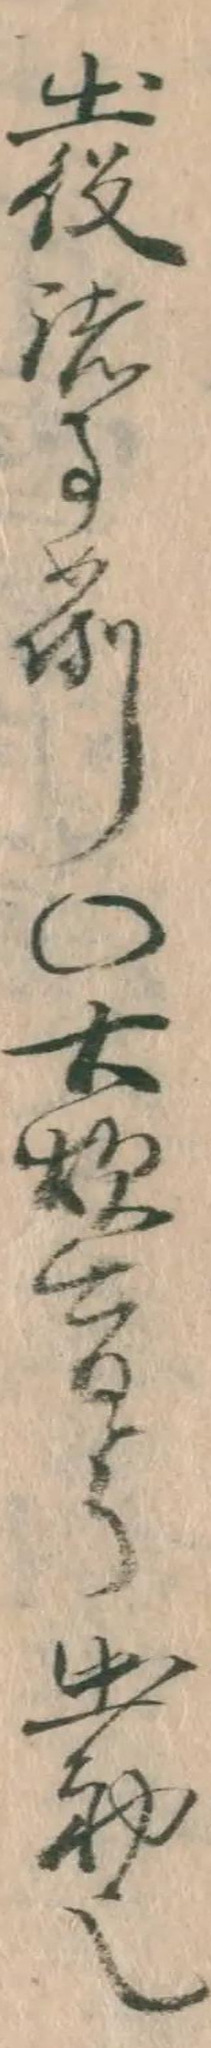出役諸事如前○大炊今日より出勤也
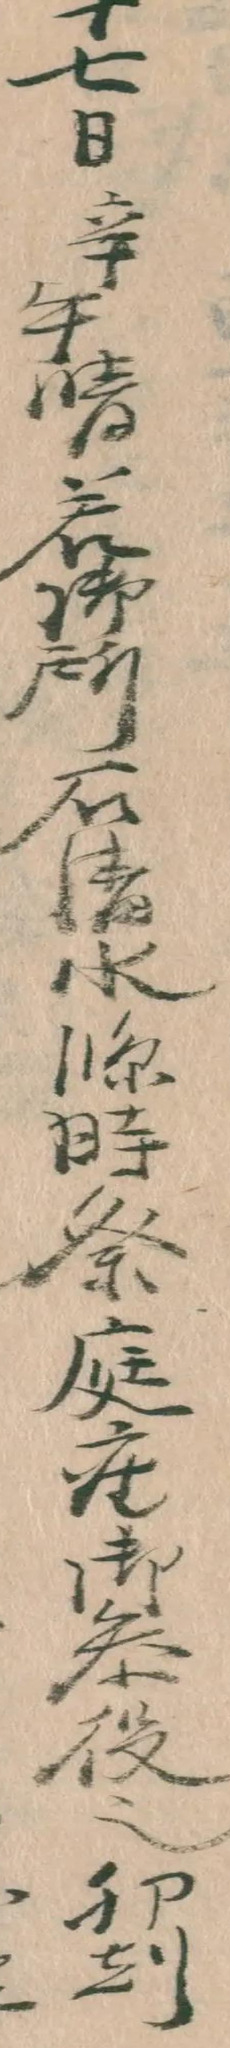十七日辛午晴若御所石清水臨時祭庭座御参役也卯刻
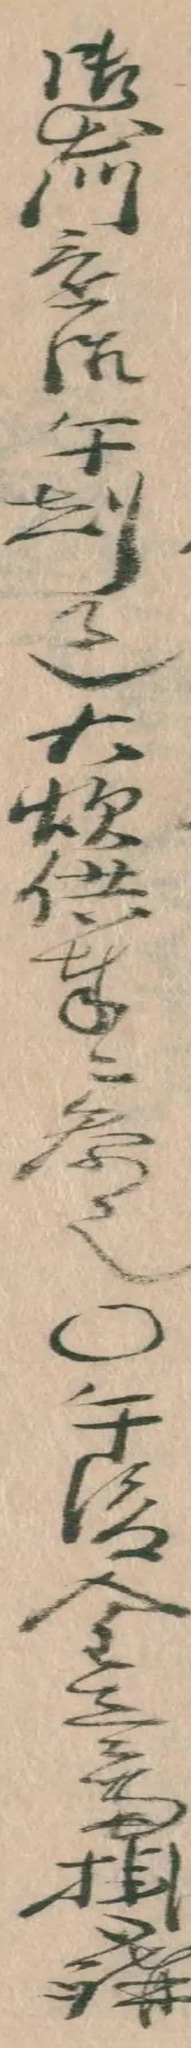御出門還御午刻過大炊供奉ニ参也○午後金壱両掛御講
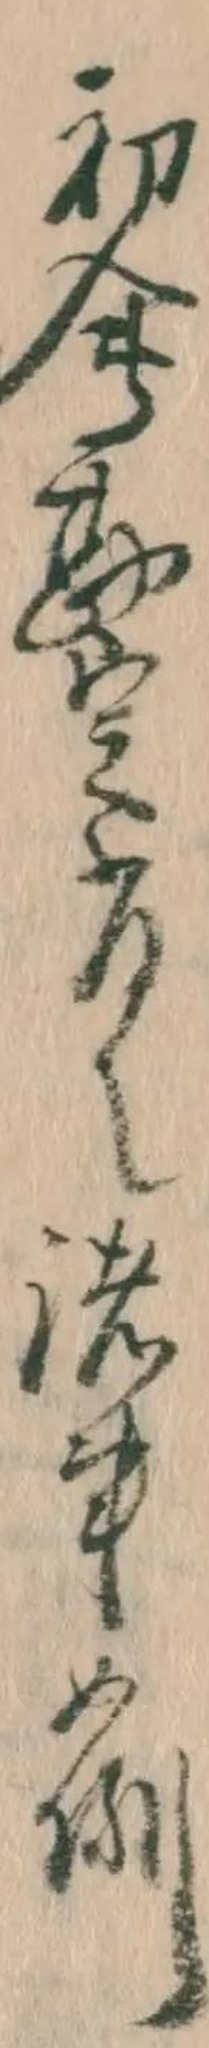初會勘定有之諸事如例
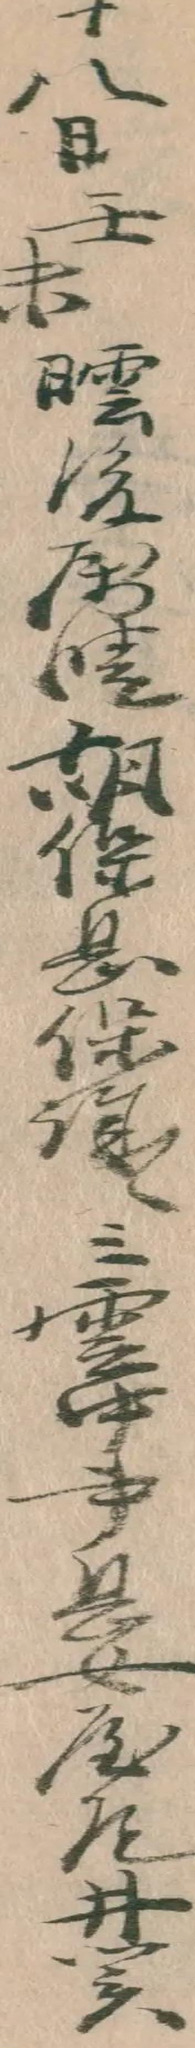十八日壬申曇後属晴胡保息保織へ三雲中寺ノ息女屋居井関
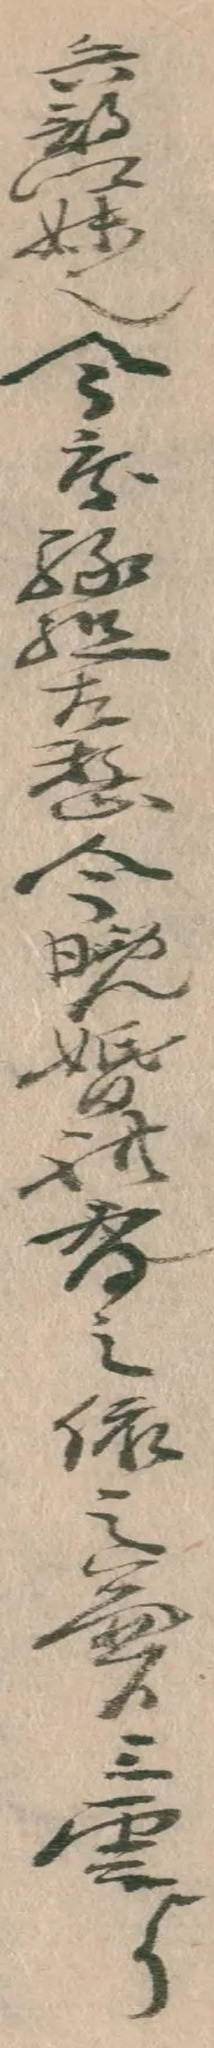兵部卿妹也今度縁組左整今晩婚禮有之依之兼日三雲より
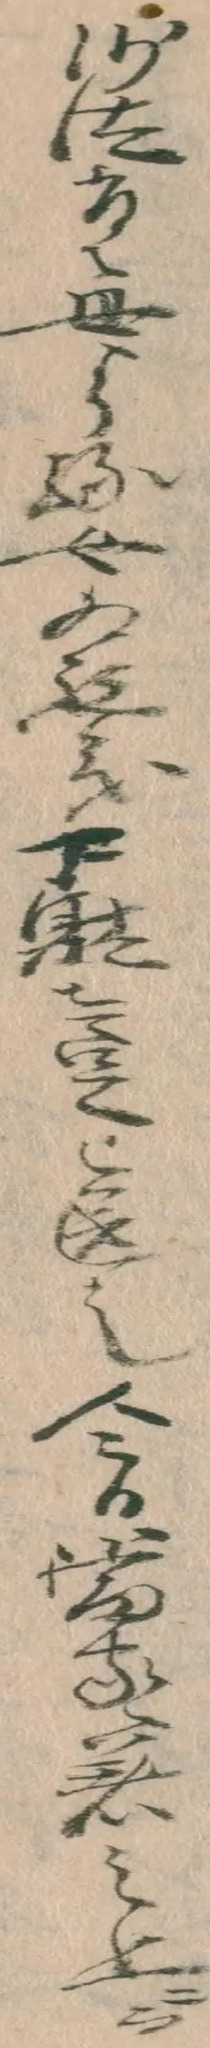沙汰有之母より縁女為程義下瀬壱足被送之今日當家へ着之上ニ而
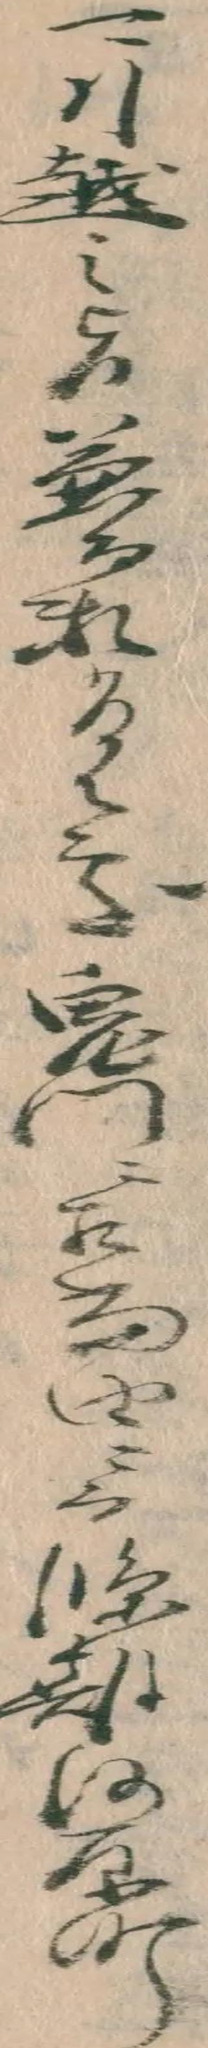可引越之旨兼而頼有之處鬼門に相當由に而臨期河原町
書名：賀茂社記録. 第66冊
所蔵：国立国会図書館 National Diet Library, JAPAN
